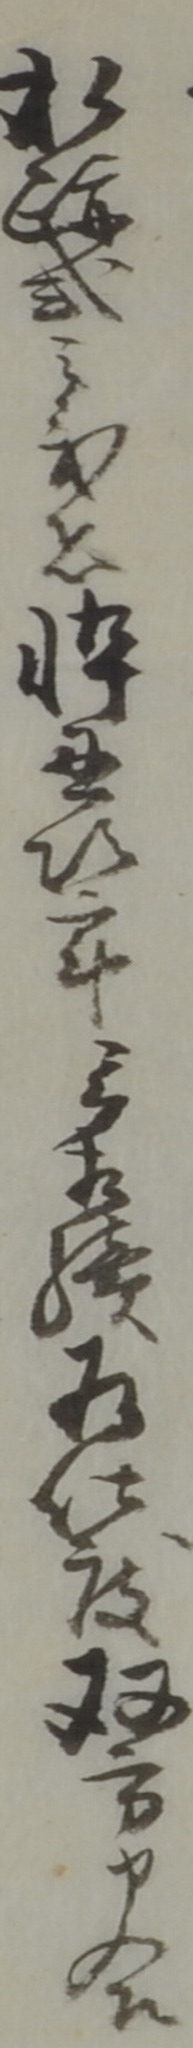私跡式之義者忰丑次郎ニ而相続為仕度双方申合
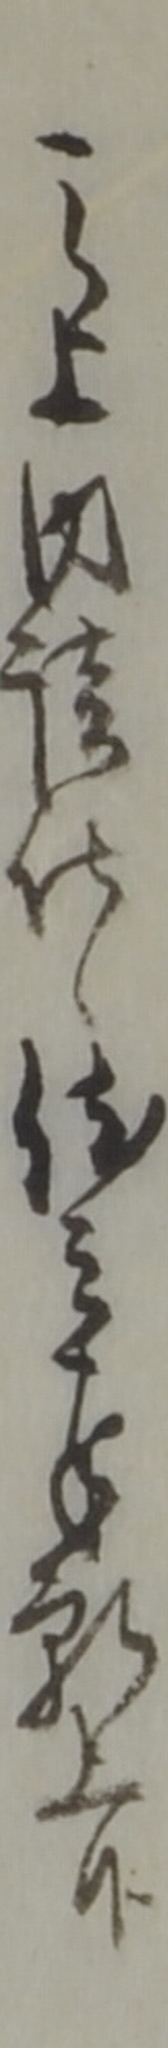之上内談仕候依之奉願上候
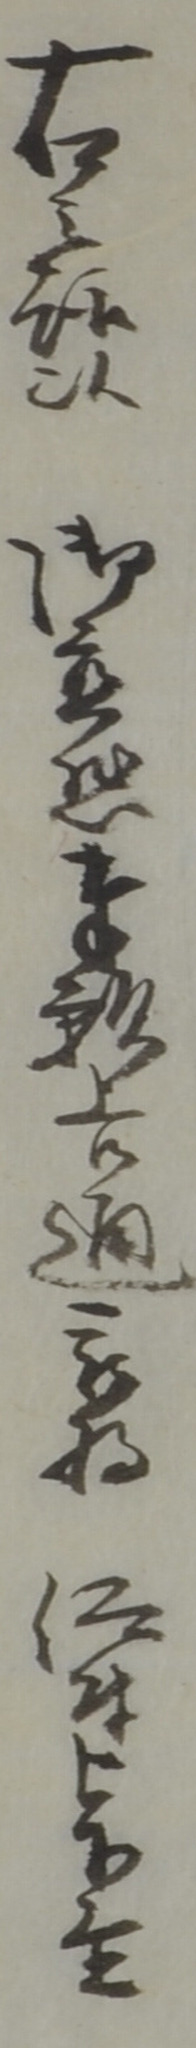右之趣以御慈悲奉願上候通被為仰付被下置
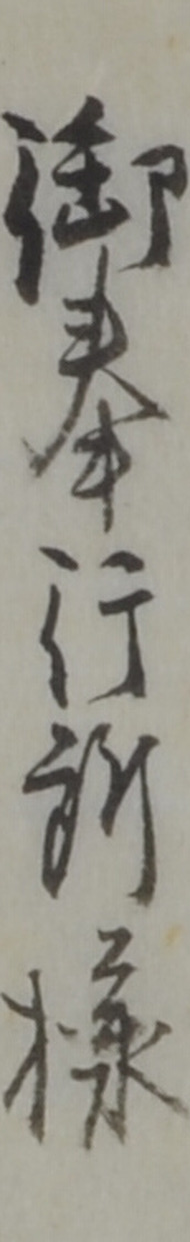御奉行所様
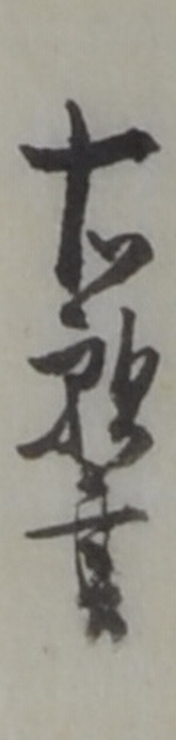右願書

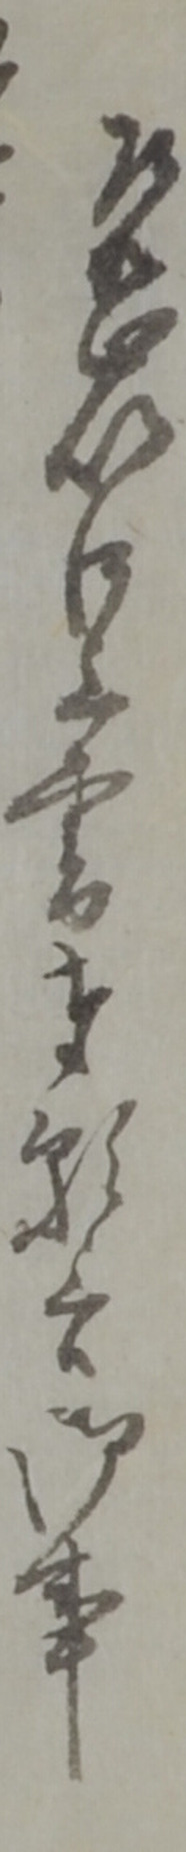乍恐以口上書奉願上候御事
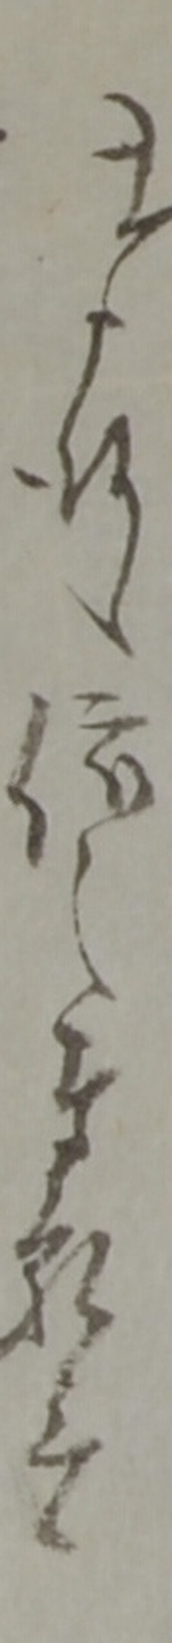奉存候依之奉願上候
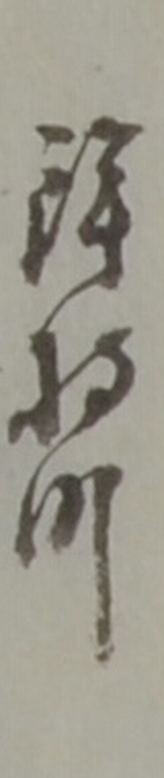鉾持町
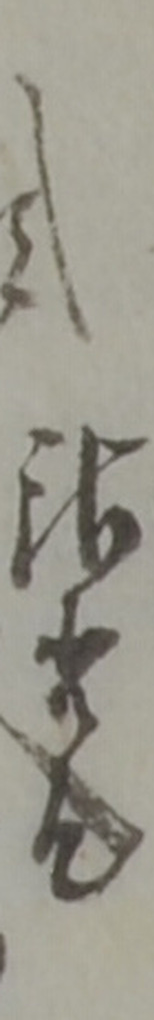銀杏屋
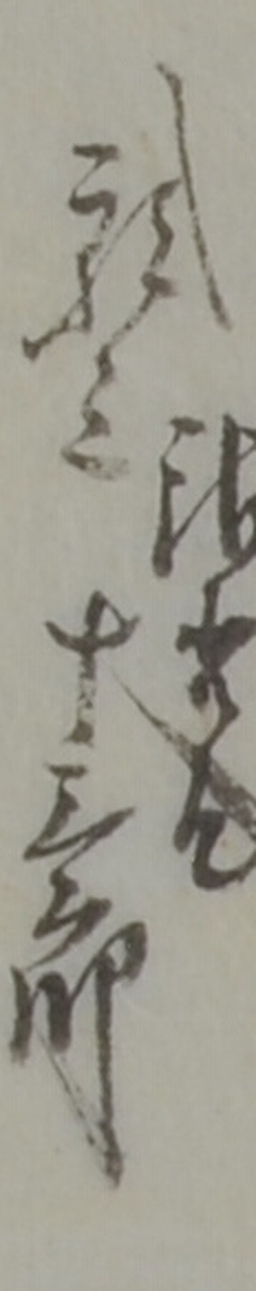願主十三郎
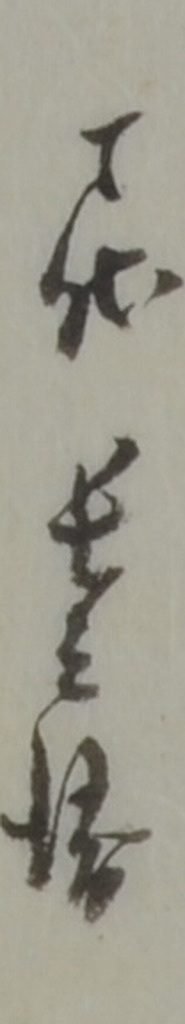丁代長兵衛
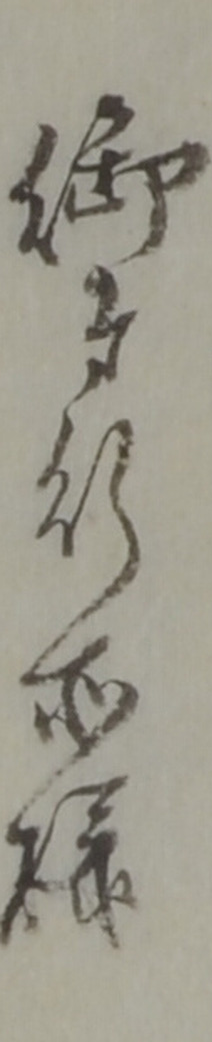御奉行所様
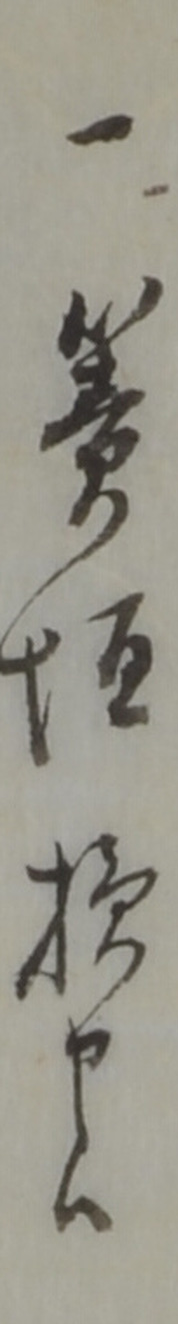一簀垣損申候
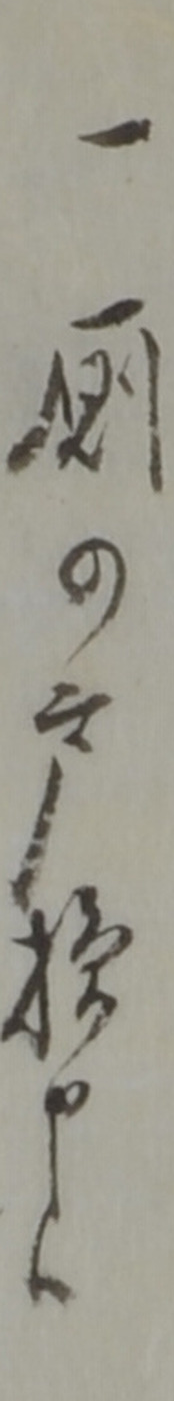一厠の戸損申候
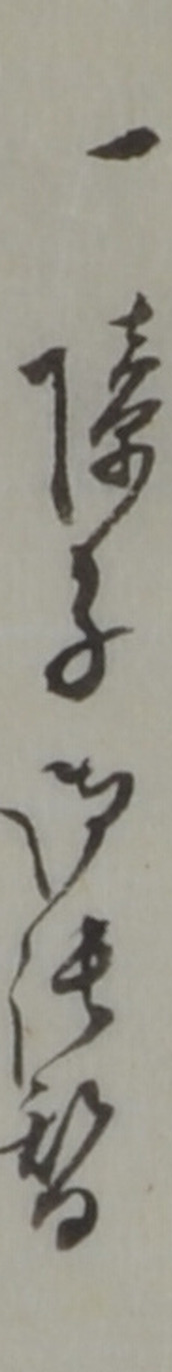一障子御張替
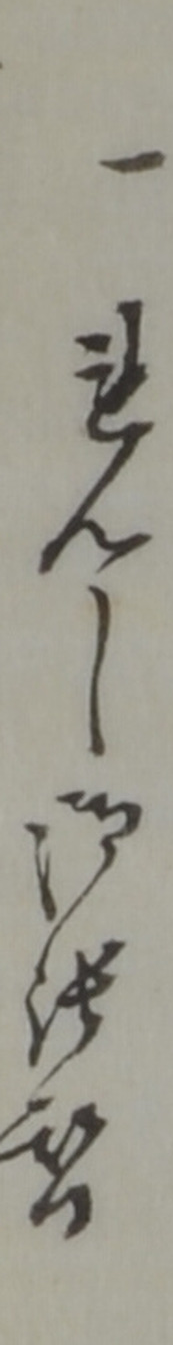一れんし御張替
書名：諸願書控簿
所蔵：伊那市立高遠町図書館・合同会社AMANE
